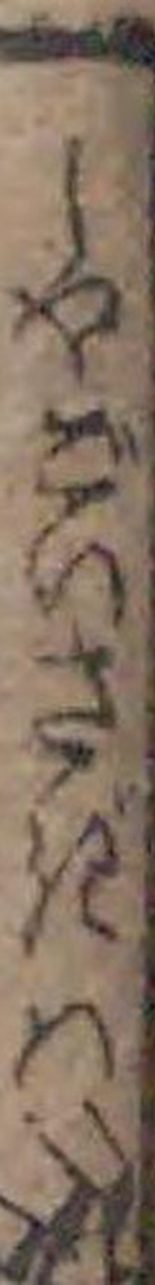しやごいさぎは
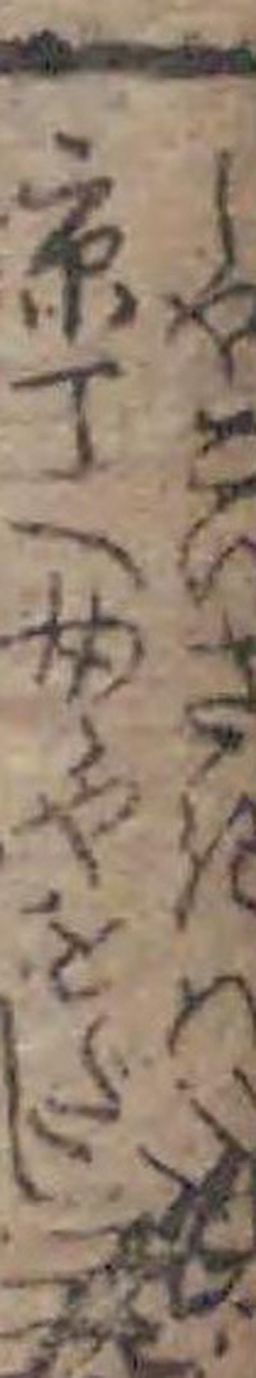京丁へ女郎やをだし
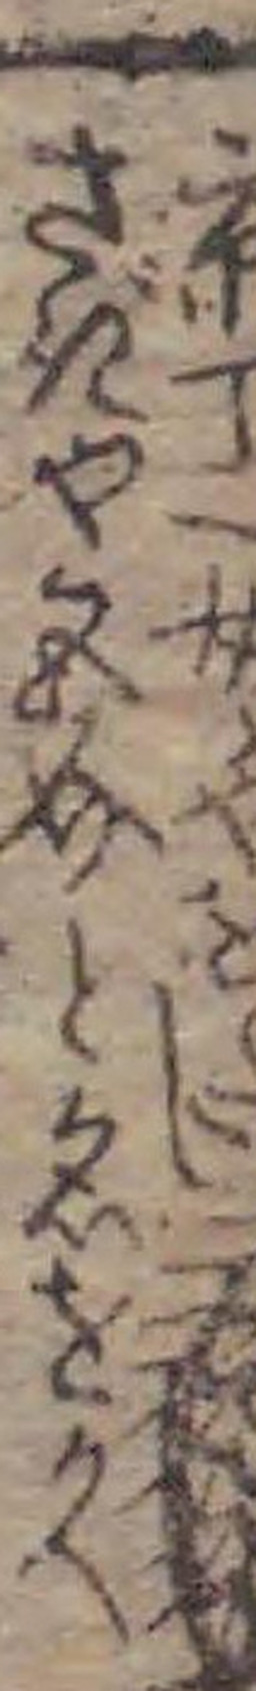さきや五介と名をかへ
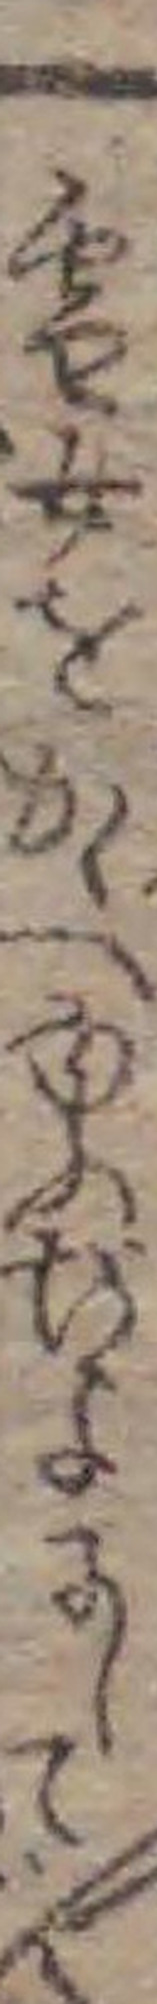雪女をかゝへゆふぢよにして
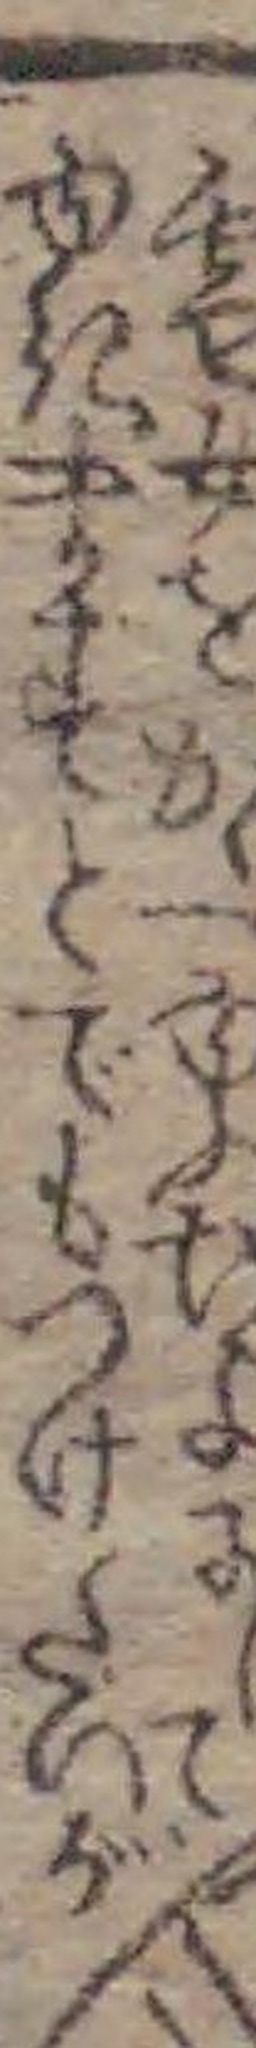ゆきますとでもつけたいが
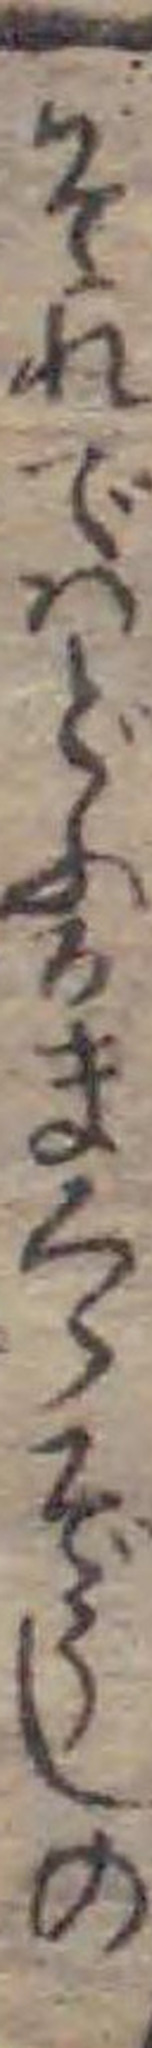それではどふかまくらぞうしの
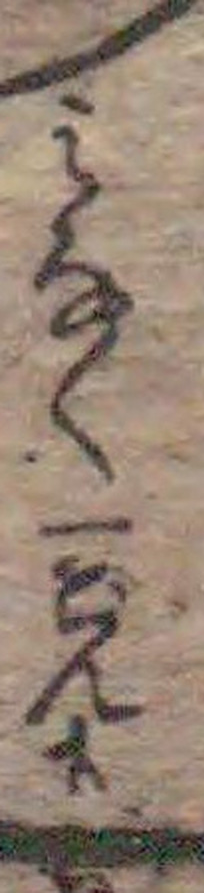みな〳〵一ごんも
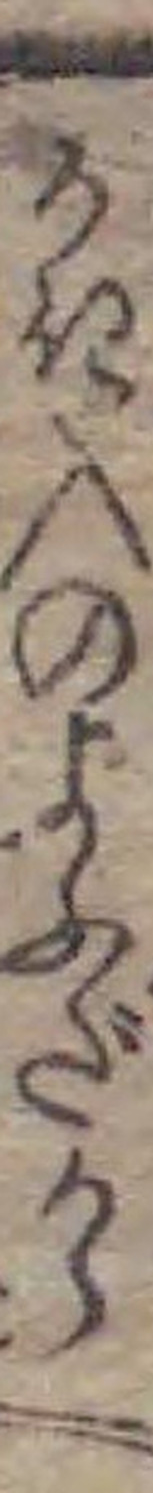かき入のよふだから
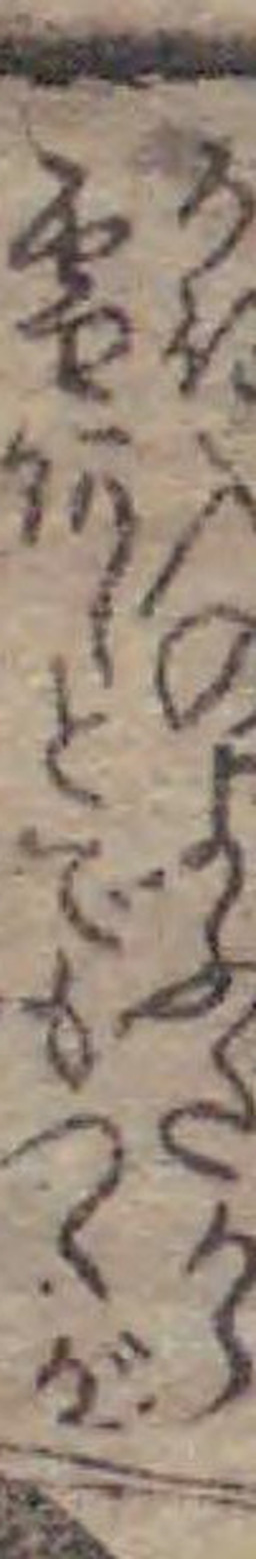雪あしとでもつくが
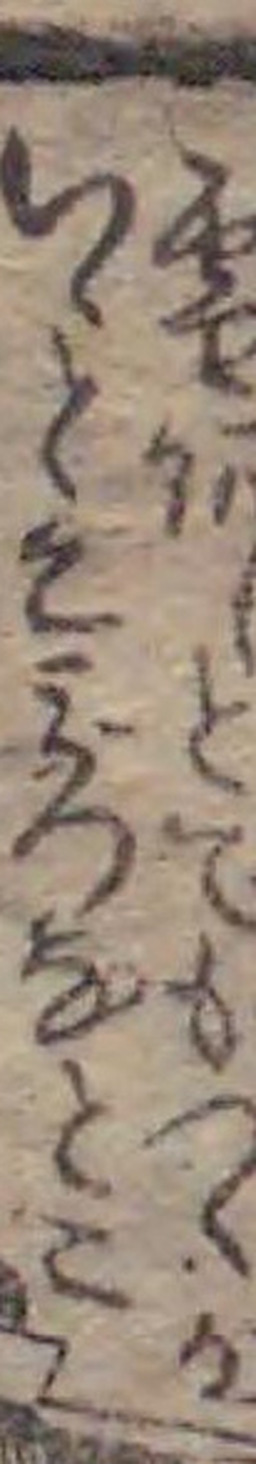いゝとこみつなとこ
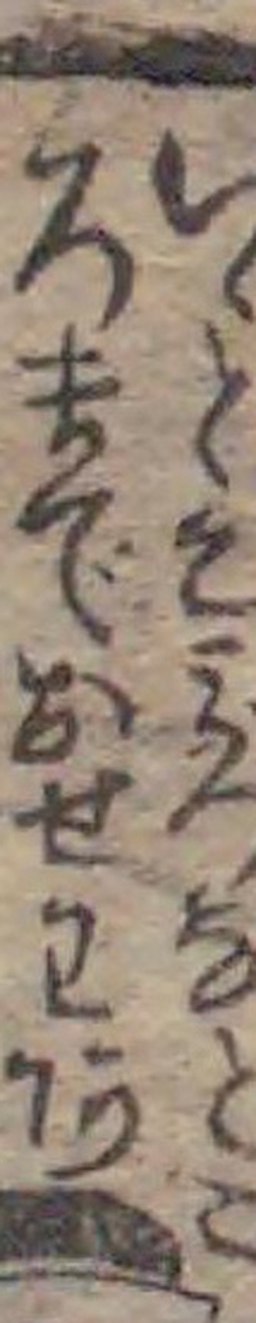ろまでおせわあ
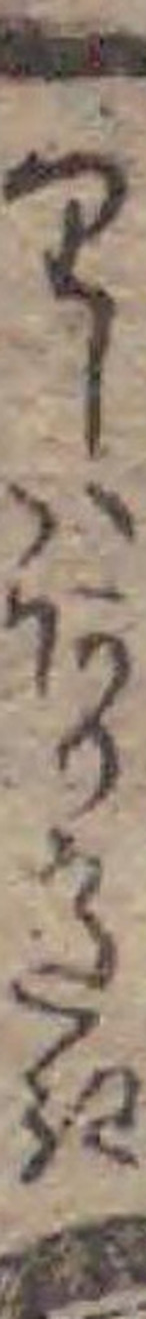りしはありかたき
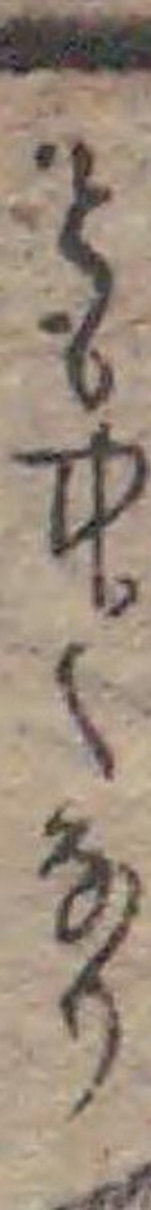とも中〳〵なり
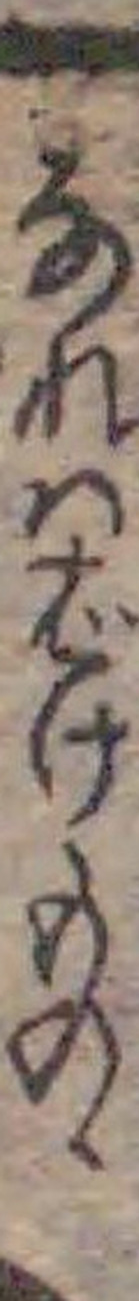なれはばけものゝ
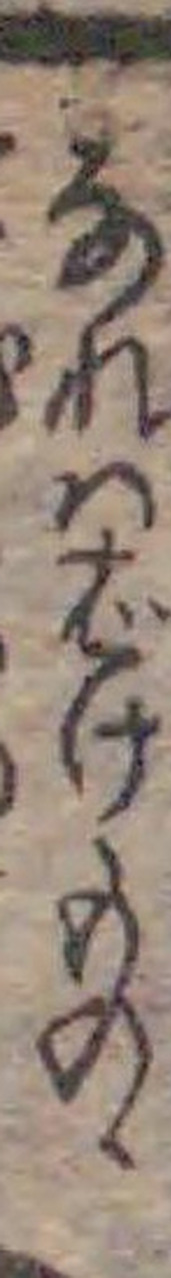なれはばけものゝ
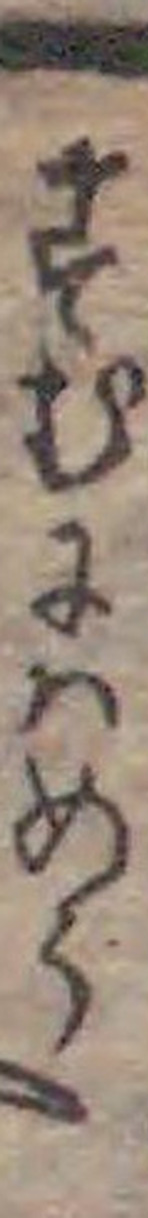すむにはめう
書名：化物楽屋異牒 : 2巻
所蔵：国立国会図書館 National Diet Library, JAPAN
